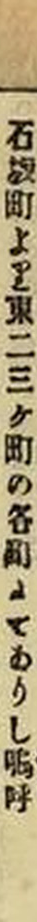石坂町より東二三ヶ町の各町にてありし嗚呼
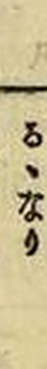るゝなり
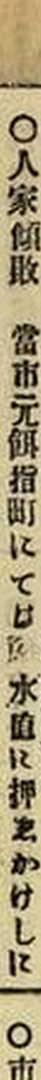○人家傾敗當市元餌指町にては溢水直に押しかけしに
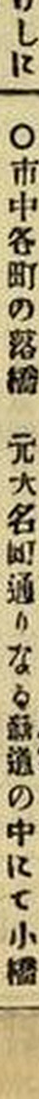○市中各町の落橋元大名町通りなる新道の中にて小橋
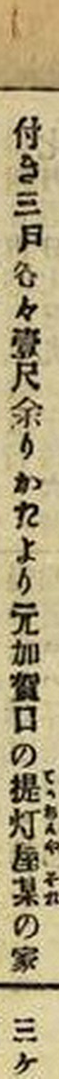付き三戸各々壹尺余りかたより元加賀口の提灯屋某の家
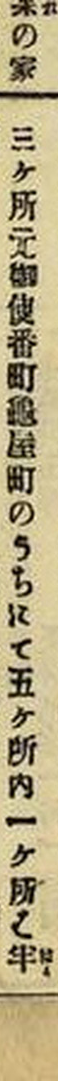三ヶ所元御使番町龜屋町のうちにて五ヶ所内一ヶ所は半
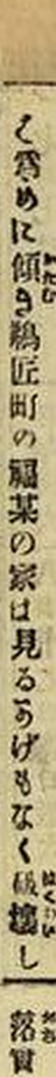は爲めに傾き鵜匠町の福某の家は見るかげもなく破壊し
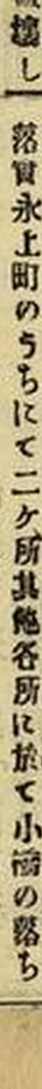落寶永上町のうちにて二ヶ所其他各所に於て小橋の落ち
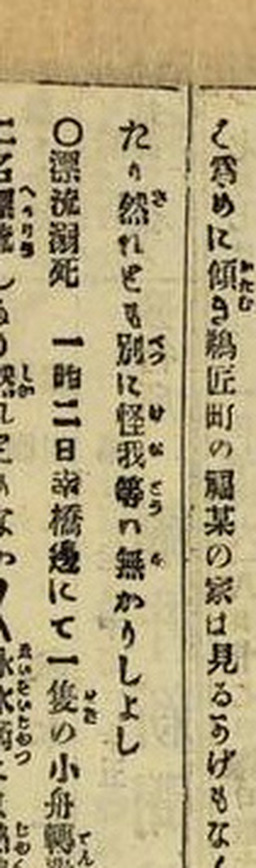たり然れども別に怪我等は無かりしよし
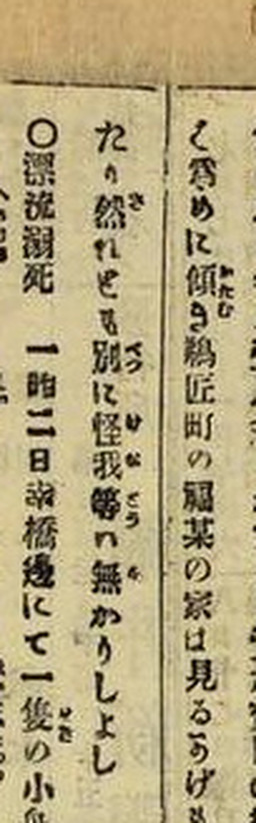たり然れども別に怪我等は無かりしよし
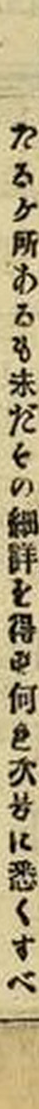たるヶ所あるも未だその細詳を得ず何れ次号に委くすべ
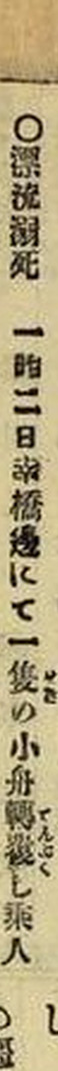○漂流溺死一昨二日幸橋邊にて一隻の小舟轉覆し乗人
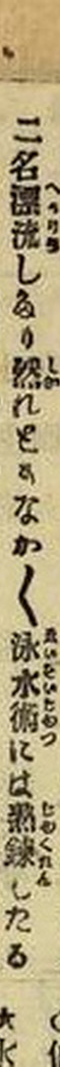二名漂流したり然れともなか〳〵泳水術には熟錬したる
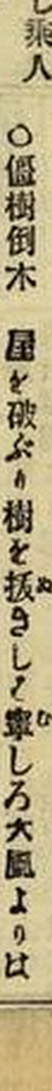○僵樹倒木屋を破ぶり樹を抜きしは寧しろ大風よりは
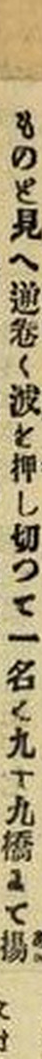ものと見へ逆卷く波を押し切つて一名は九十九橋にて揚
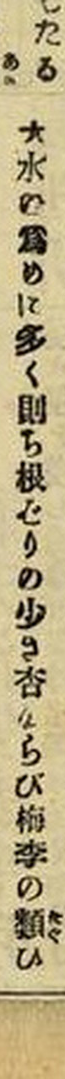大水の爲めに多く則ち根ばりの少き杏ならび梅李の類ひ
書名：温古集 五巻
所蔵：福井県文書館 Fukui Prefectural Archives
